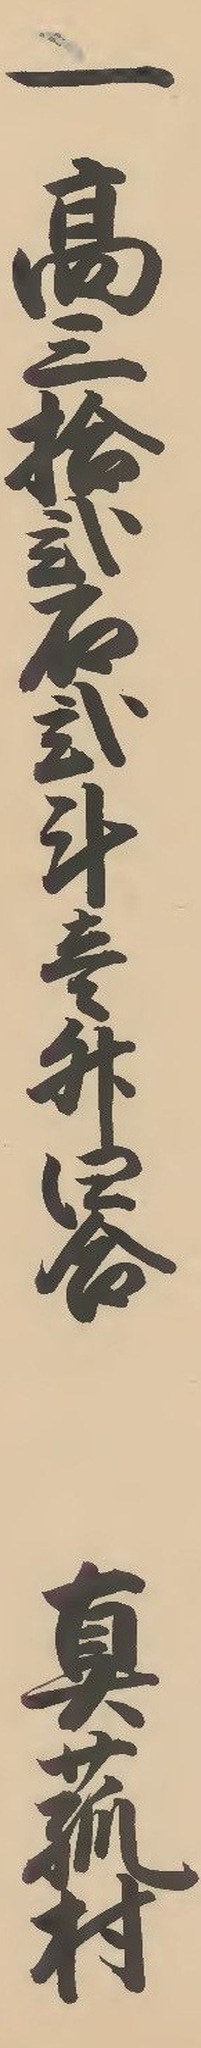一高三拾弐石弐斗壱升四合真菰村

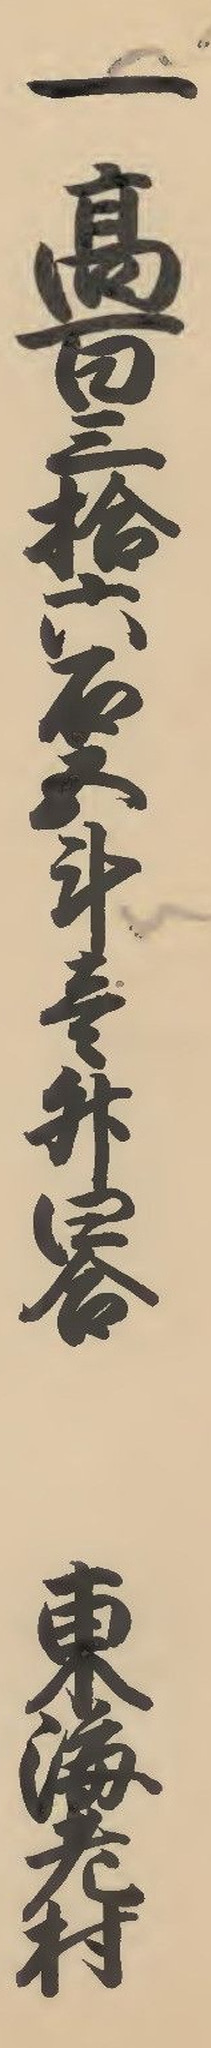一高百三拾六石五斗壱升四合東海老村
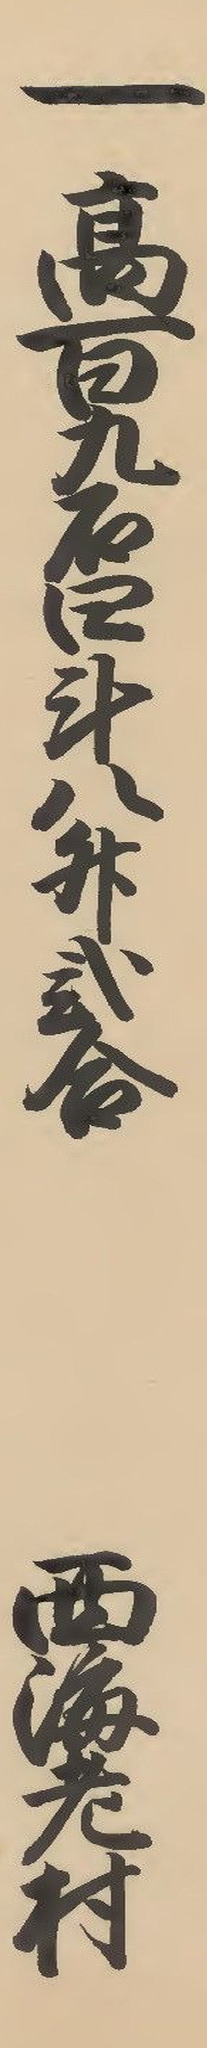一高百九石四斗八升弐合西海老村
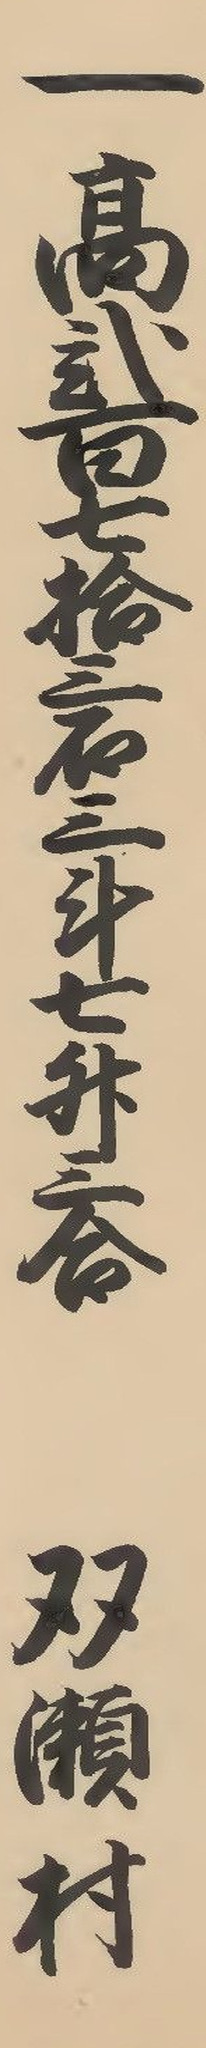一高弐百七拾三石三斗七升三合双瀬村
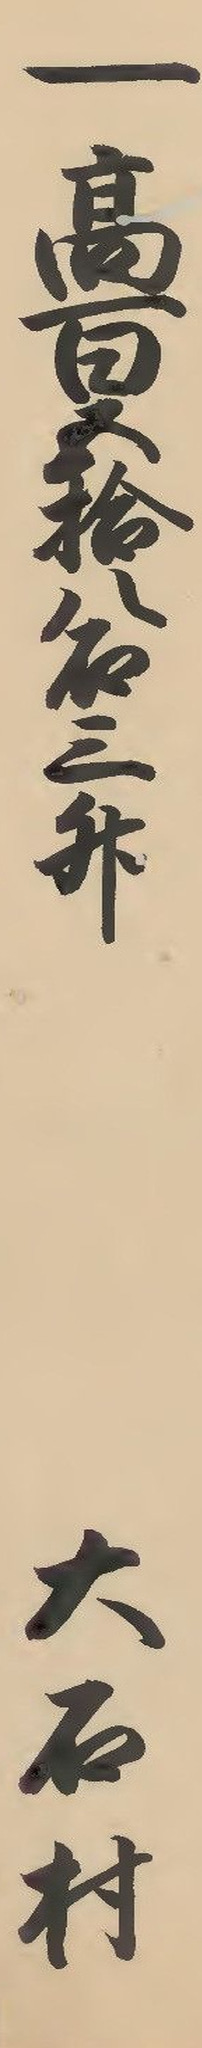一高百五拾八石三升大石村
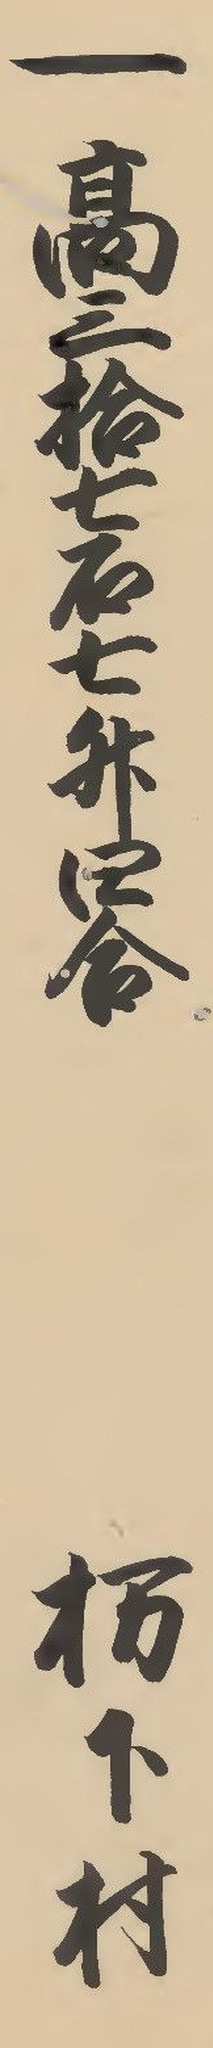一高三拾七石七升四合栃下村
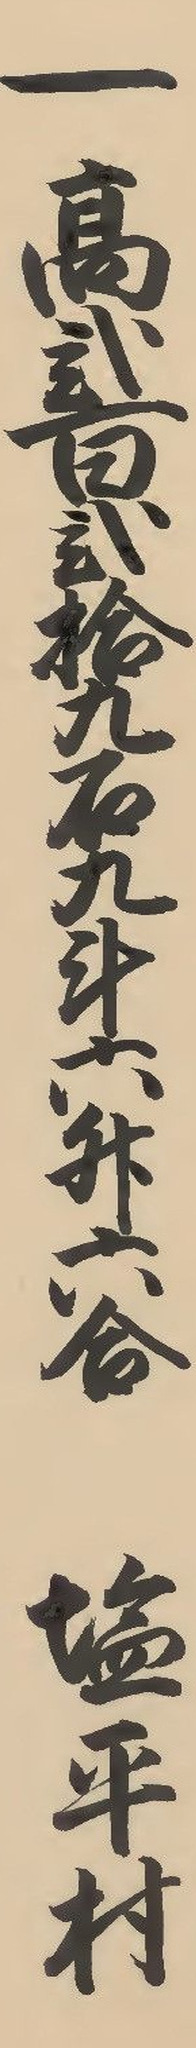一高弐百弐拾九石九斗六升六合塩平村
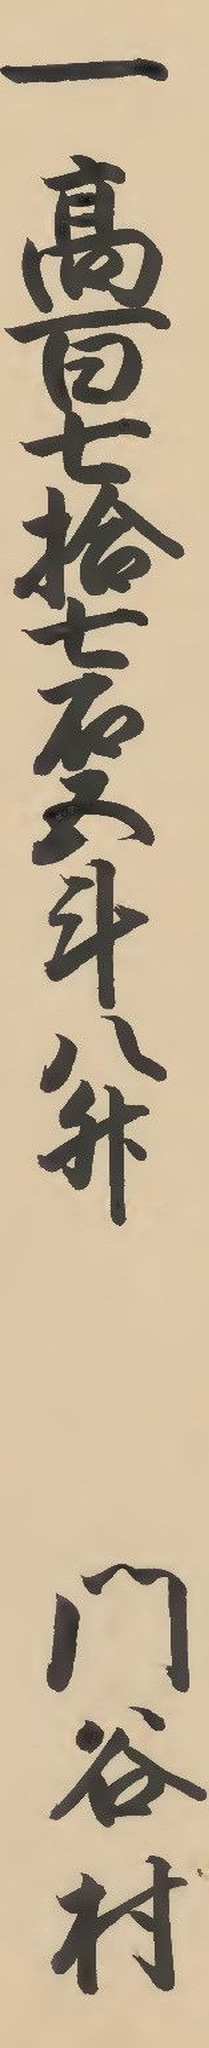一高百七拾七石五斗八升門谷村
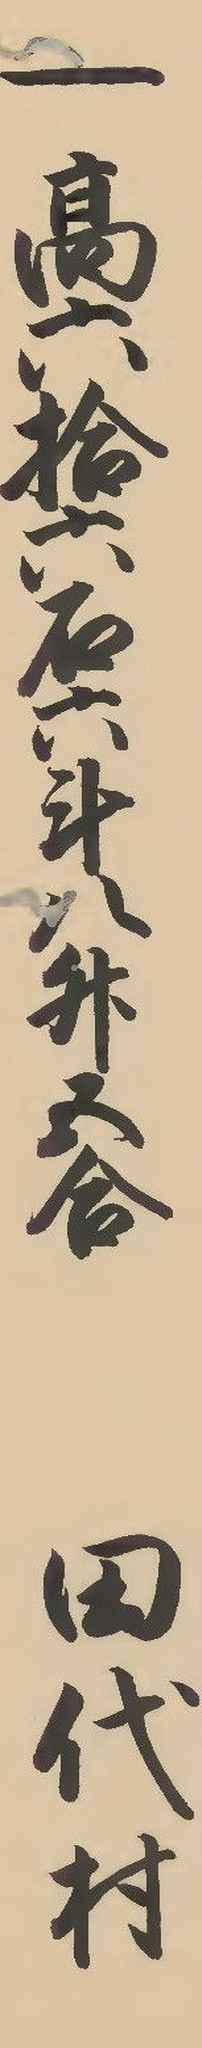一高六拾六石六斗八升五合田代村

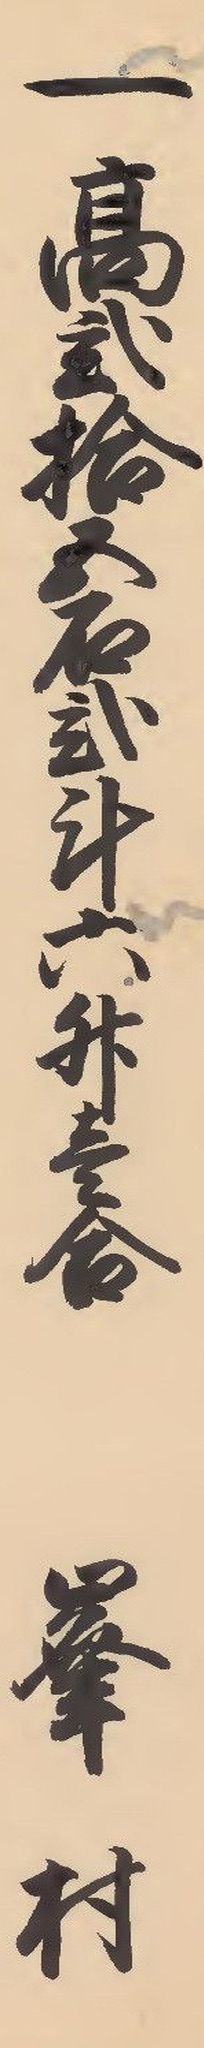一高弐拾五石弐斗六升壱合峰村
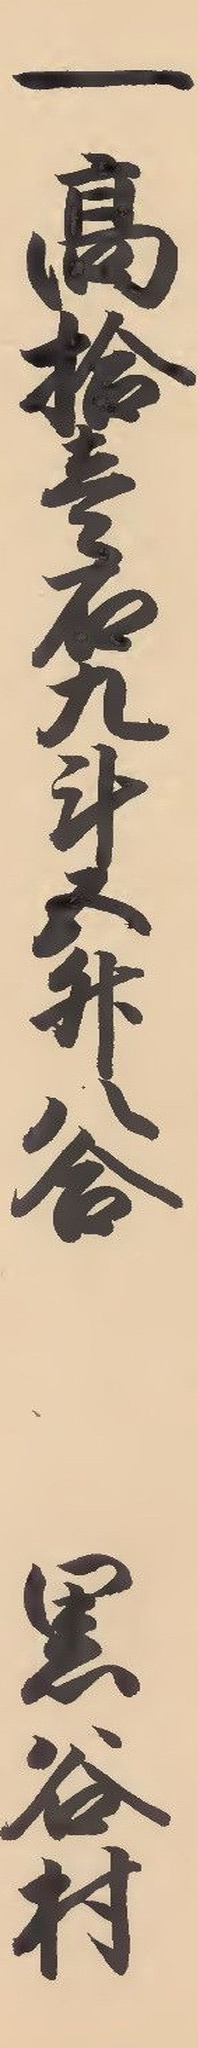一高拾壱石九斗五升八合黒谷村
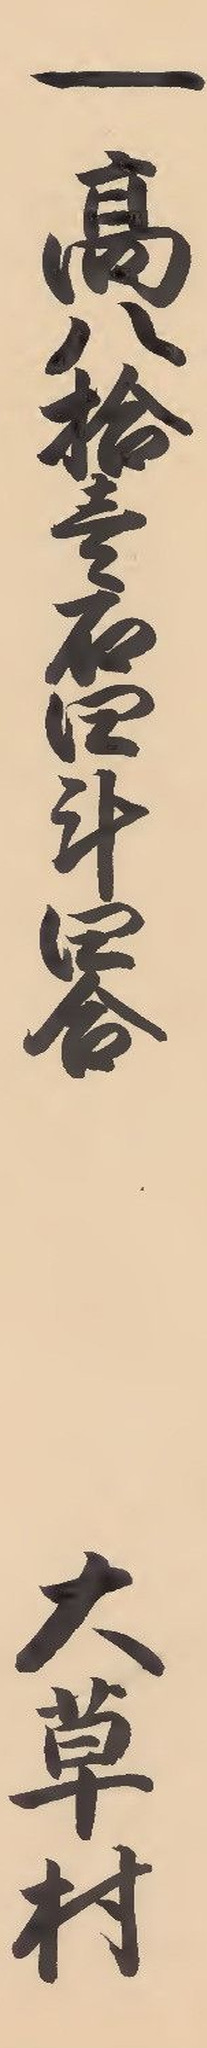一高八拾壱石四斗四合大草村
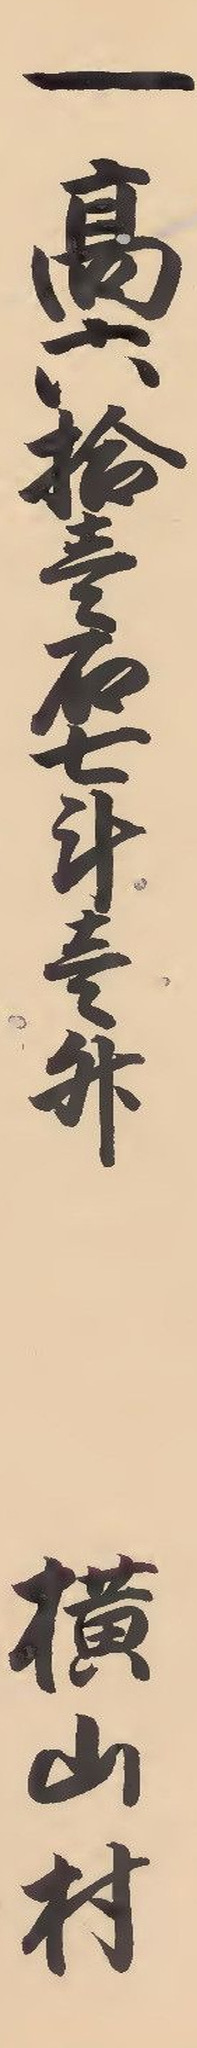一高六拾壱石七斗壱升横山村
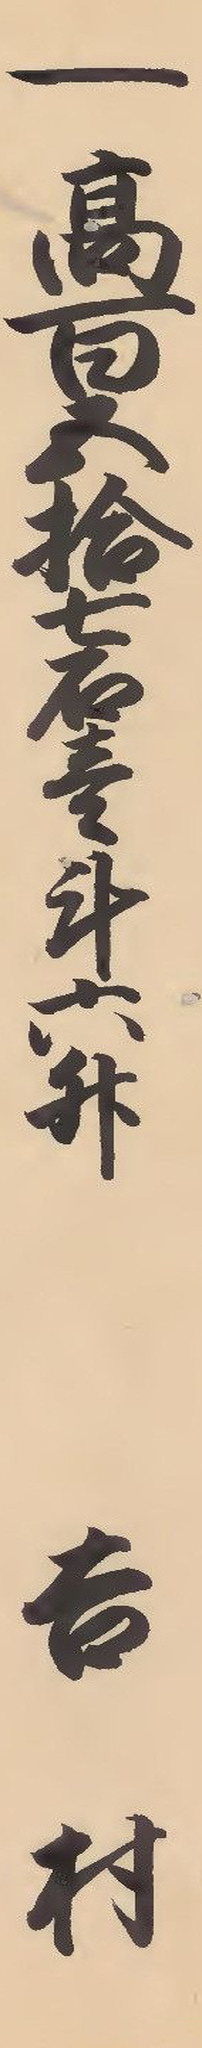一高百五拾七石壱斗六升吉村
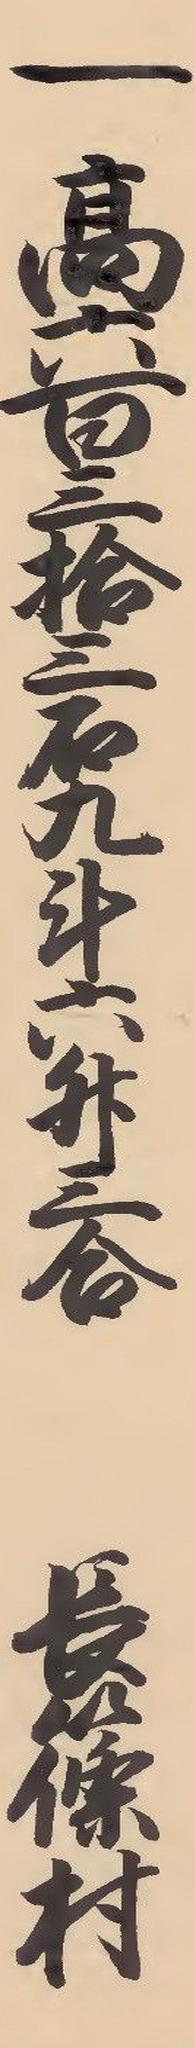一高六百三拾三石九斗六升三合長篠村
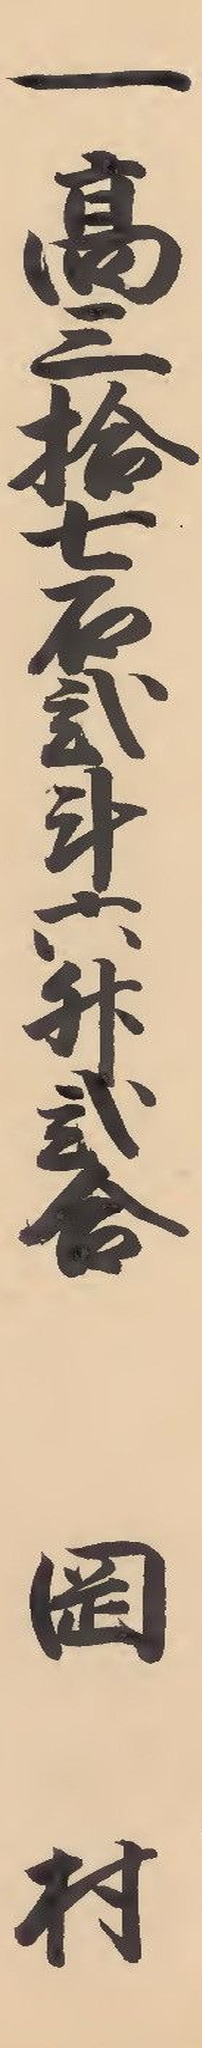一高三拾七石弐斗六升弐合岡村
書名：三河国郷帳
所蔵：国立公文書館 National Archives of Japan
